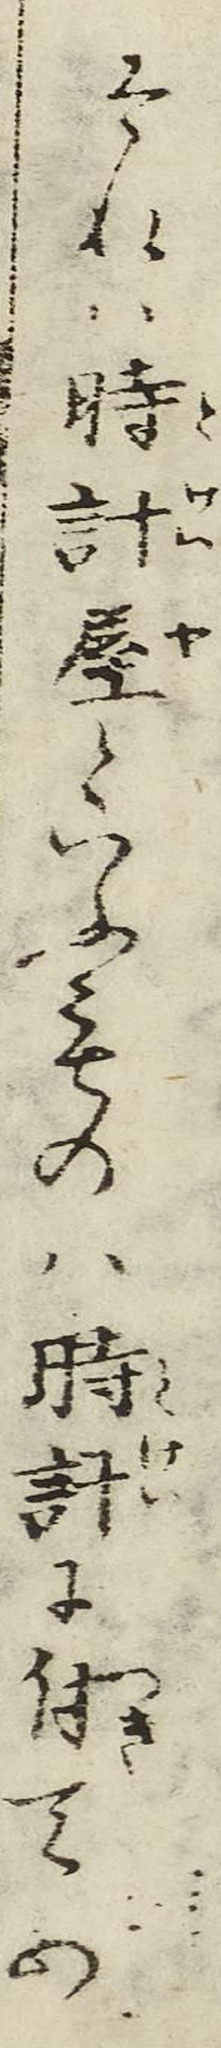それは時計屋といふものは時計に付ての

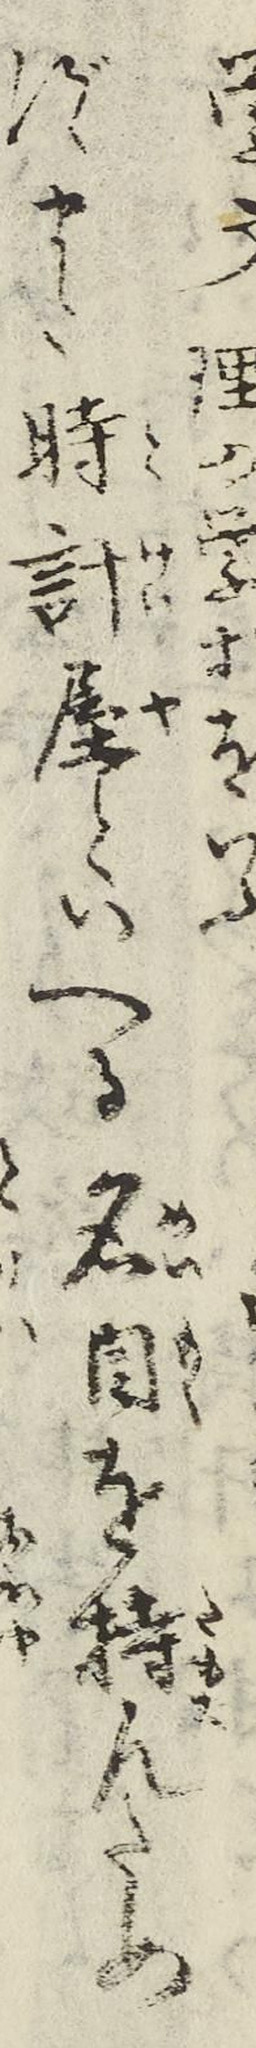ずまた時計屋といへる名目を持んため
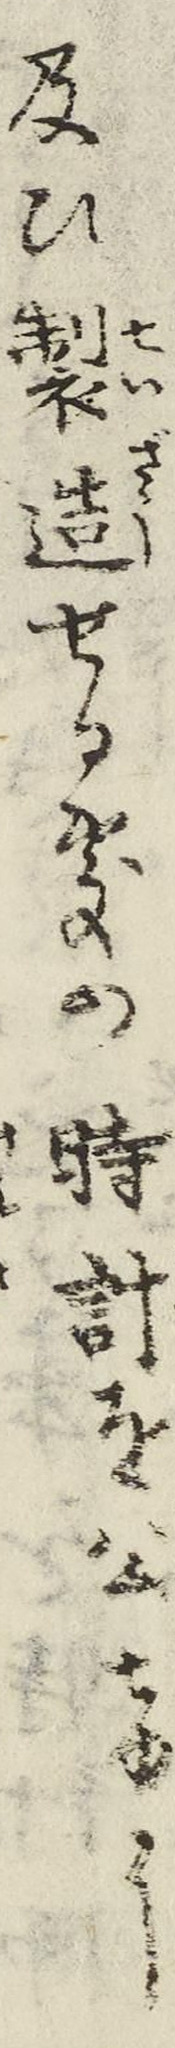及ひ製造せる処の時計を公けに
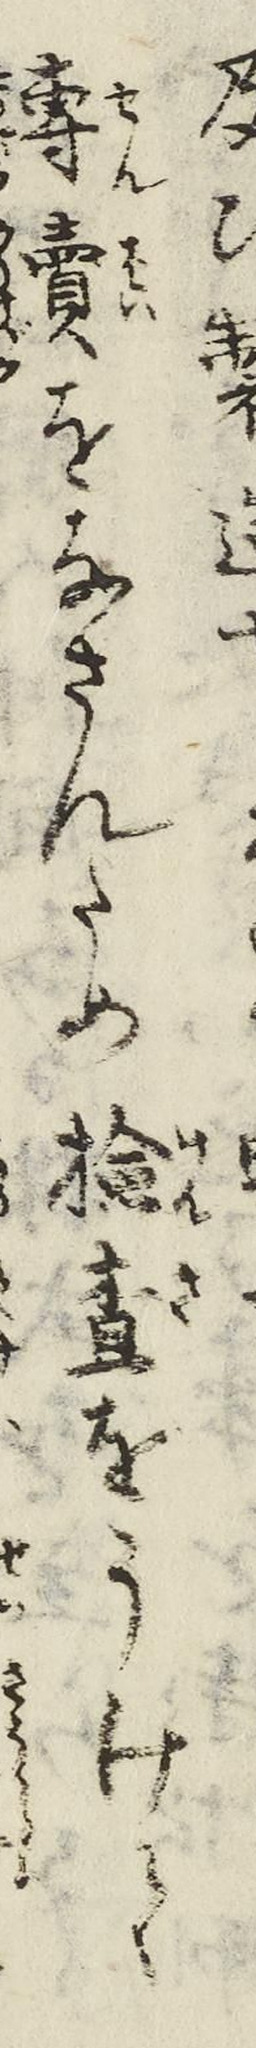専売をなさんため検査をうけて
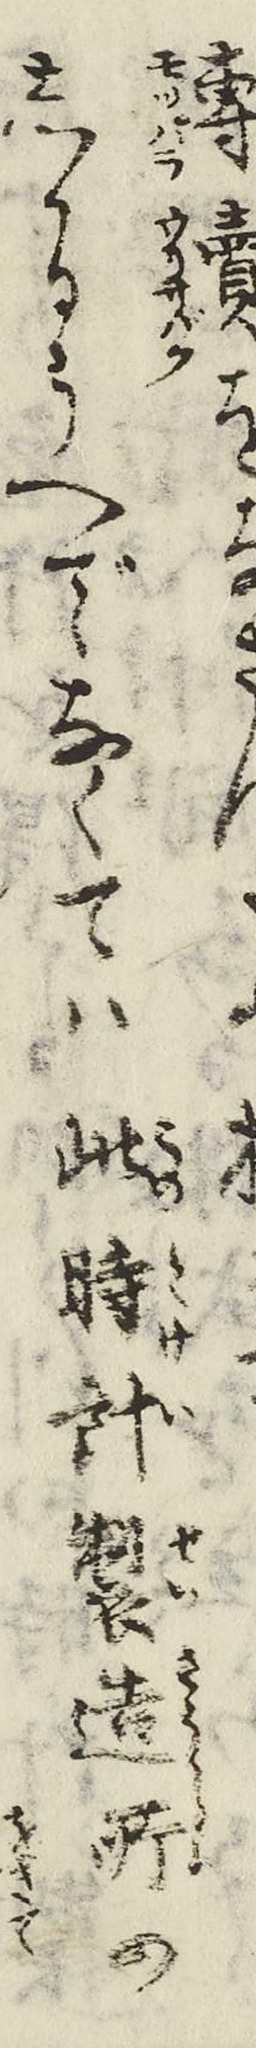しかるうへでなくては此時計製造所の
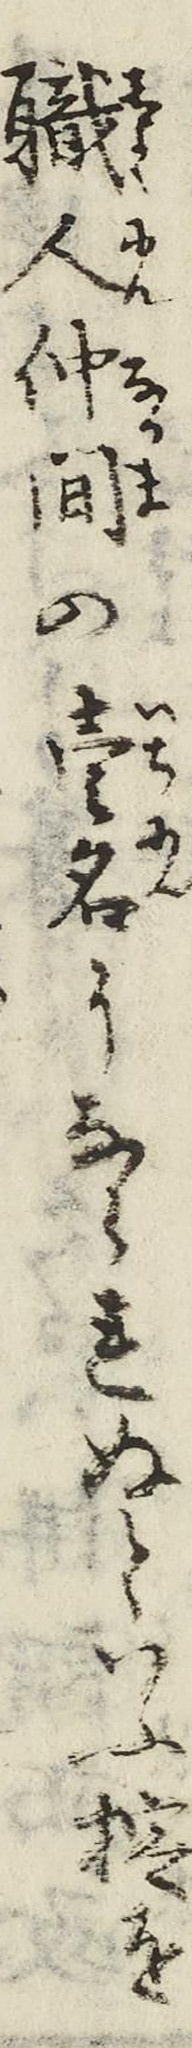職人仲間の壱名になられぬといふ掟を
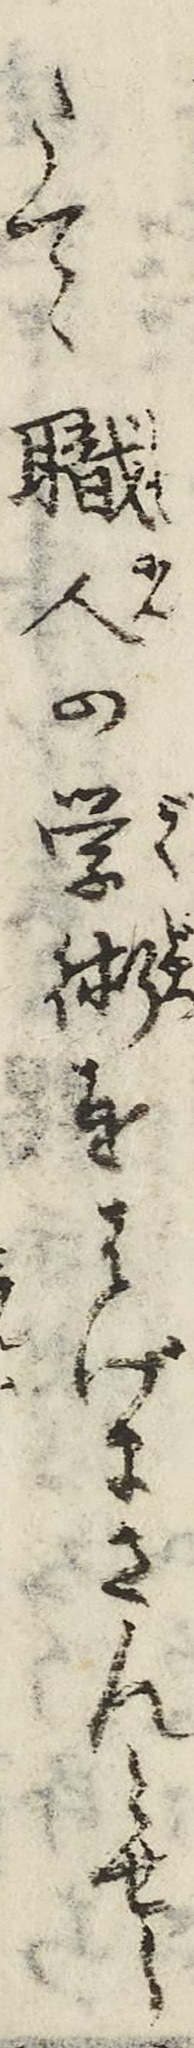たてゝ職人の学術をはげまさんとせし
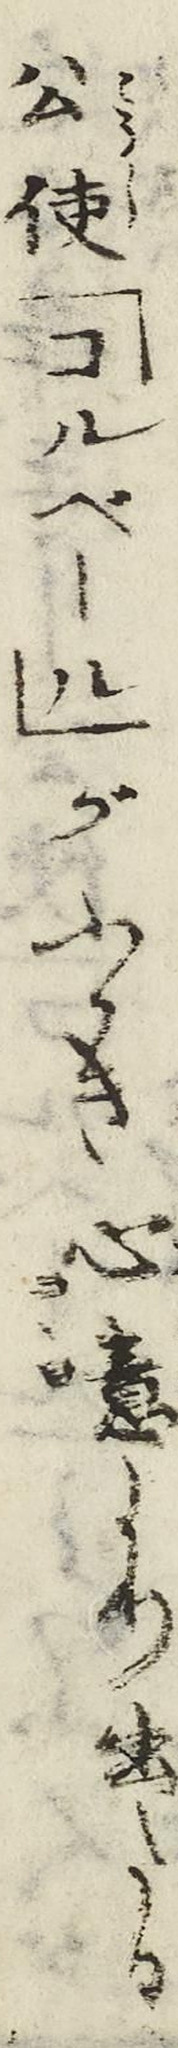公使「コルベール」がふかき心意より出たる
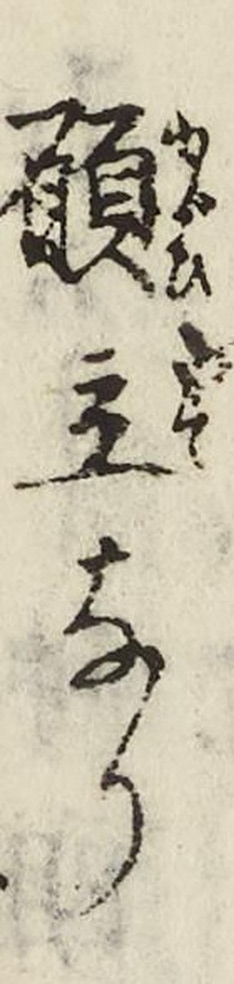願立なり
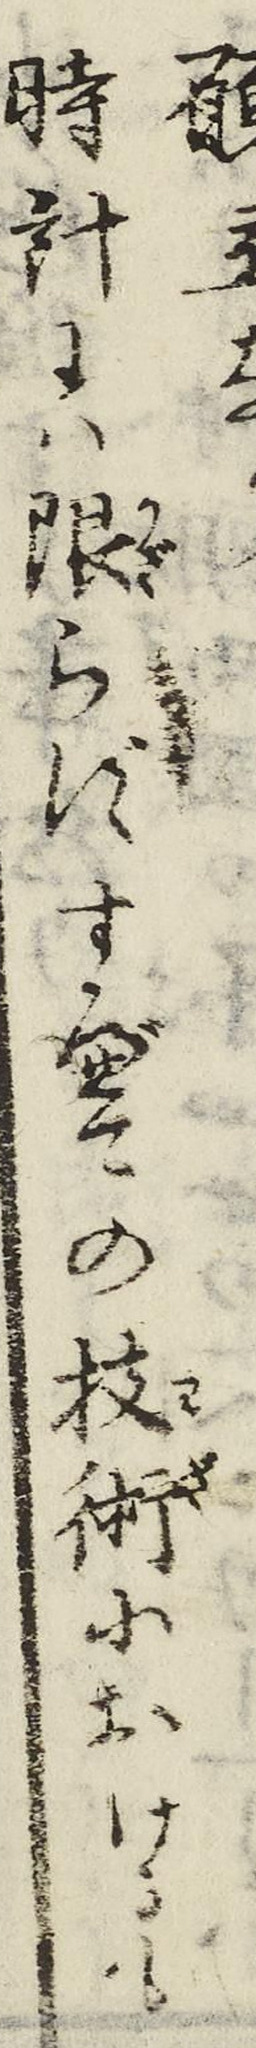時計には限らずすべての技術におけるも
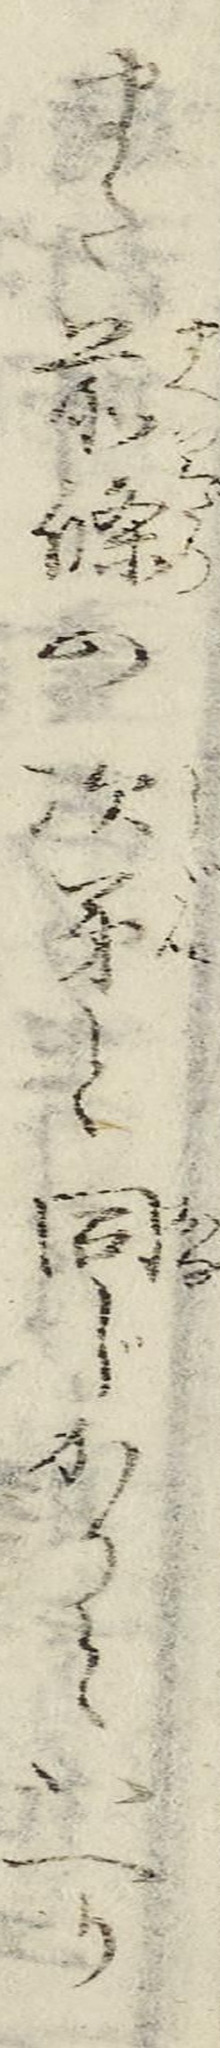また前條の次第と同じかりといへり
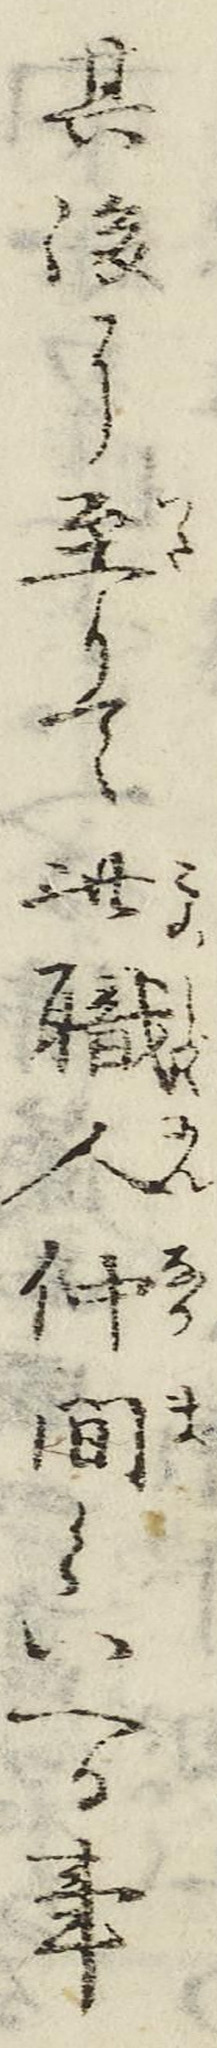其後に至りて此職人仲間といへる事
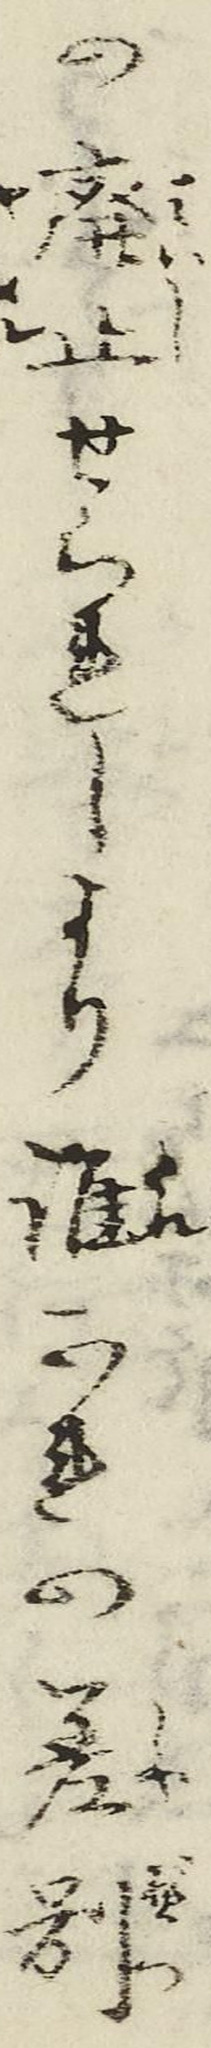の廃止せられしより誰かれの差別
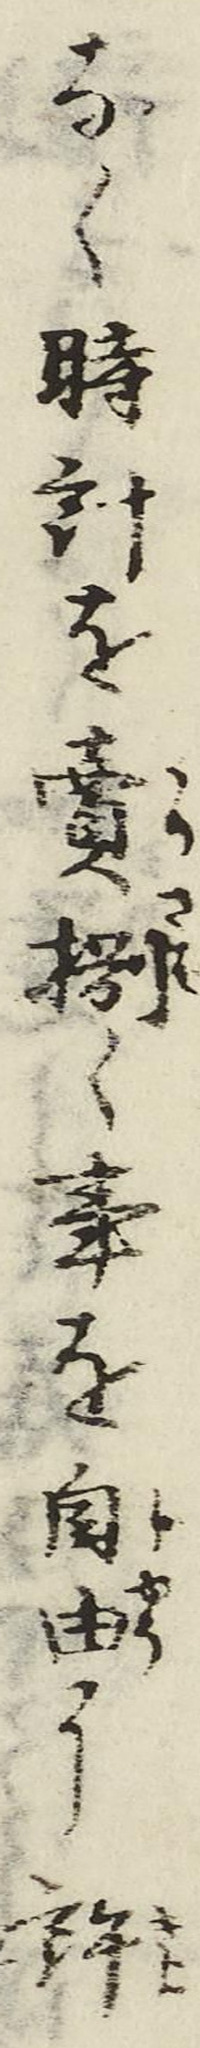なく時計を売捌く事を自由に許
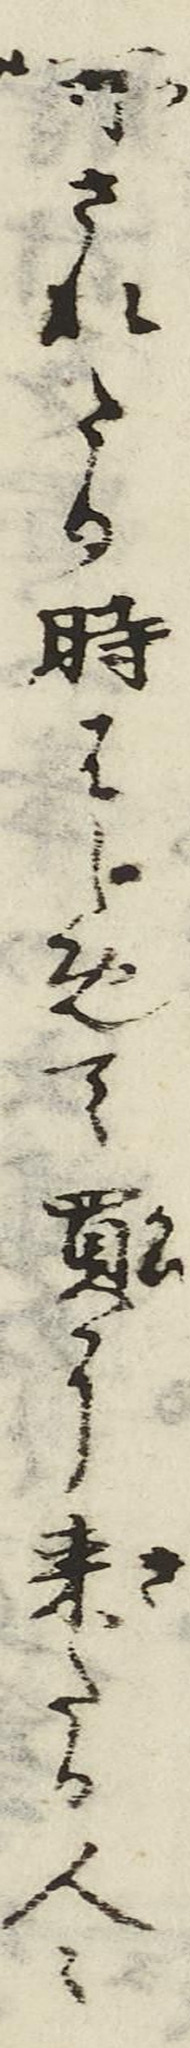可されたる時はじめて買に来たる人〻
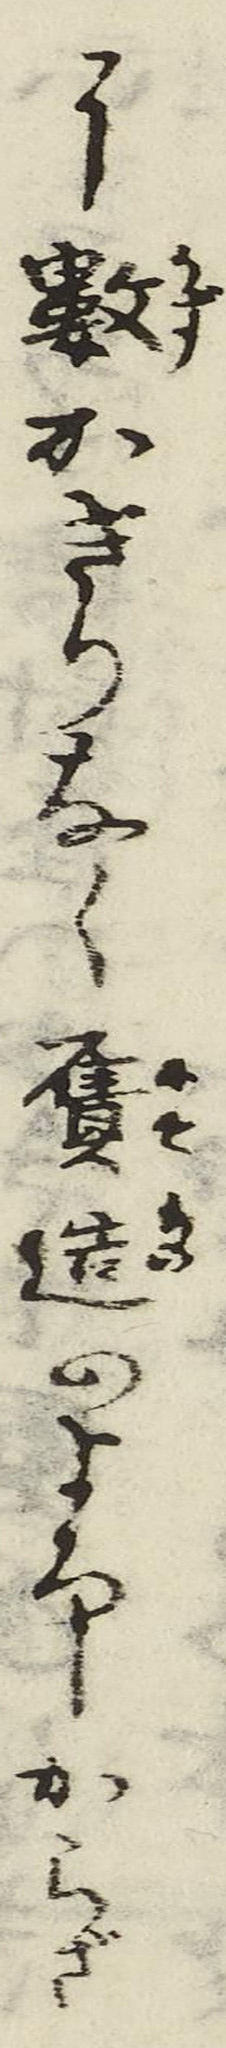に数かぎりなく贋造のよろしからざ
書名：[時計に関する冊子]
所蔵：東京大学地震研究所図書室 Earthquake Research Institute Library, The University of Tokyo, JAPAN
